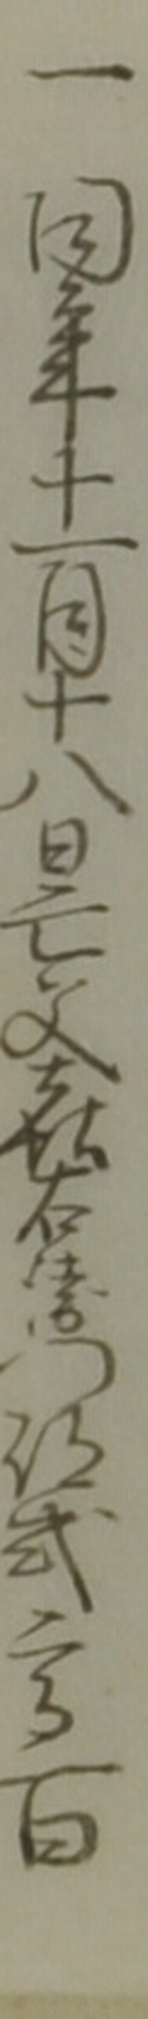一同年十一月十八日亡父喜右衛門跡式高百
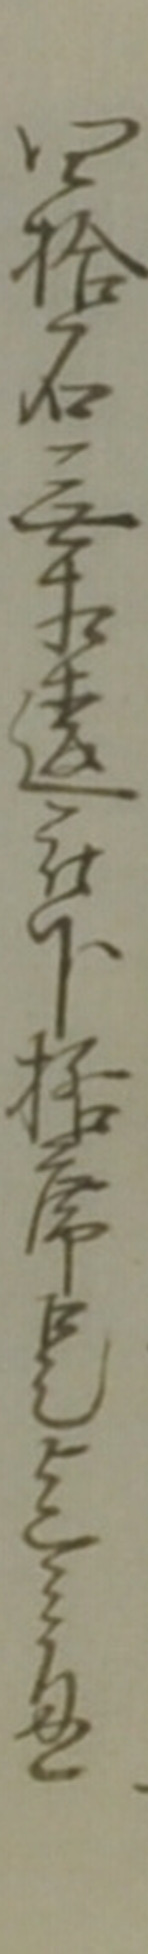四拾石無相違被下格席是迄之通
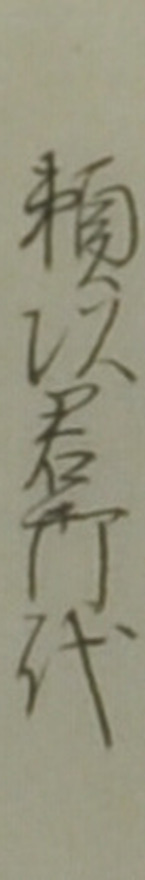頼以君御代
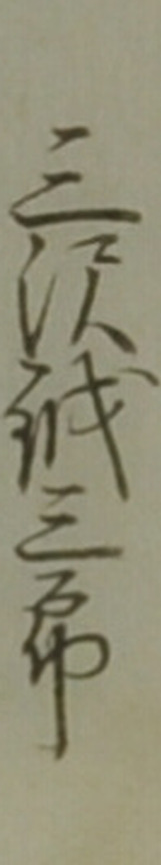三沢鉞三郎
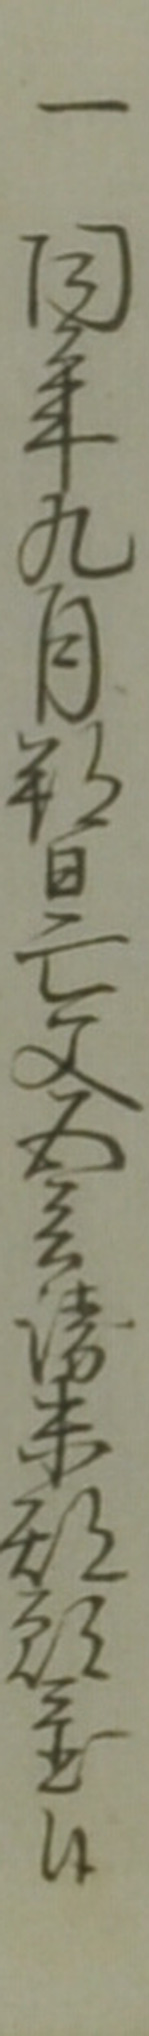一同年九月朔日亡父五兵衛末期願置候
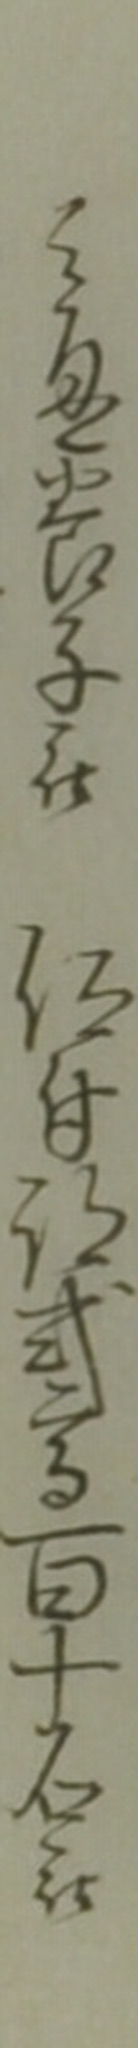之通養子被仰付跡式高百十石被
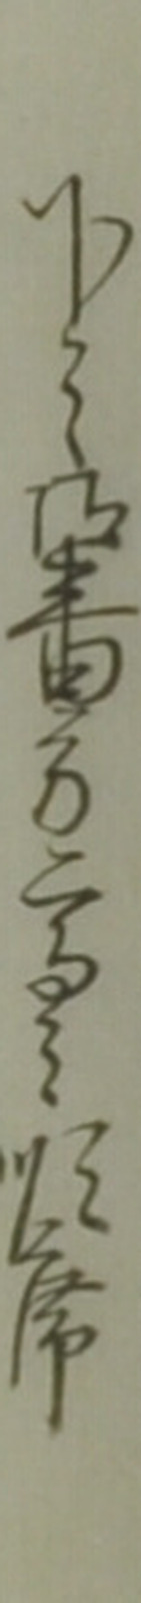下之御番方高之順席
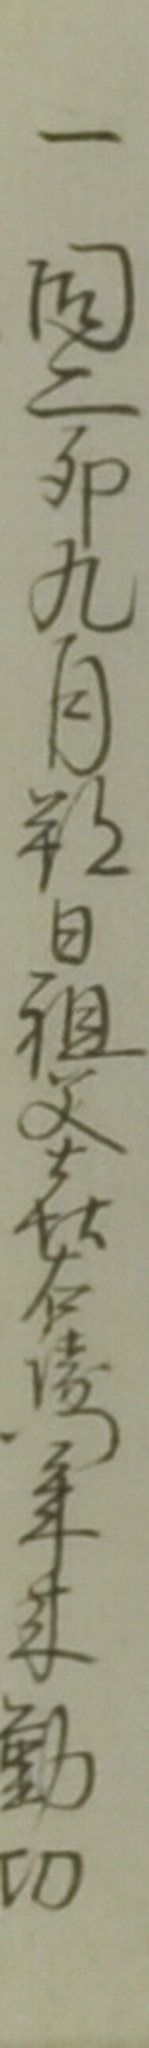一同二卯九月朔日祖父喜右衛門年来勤功
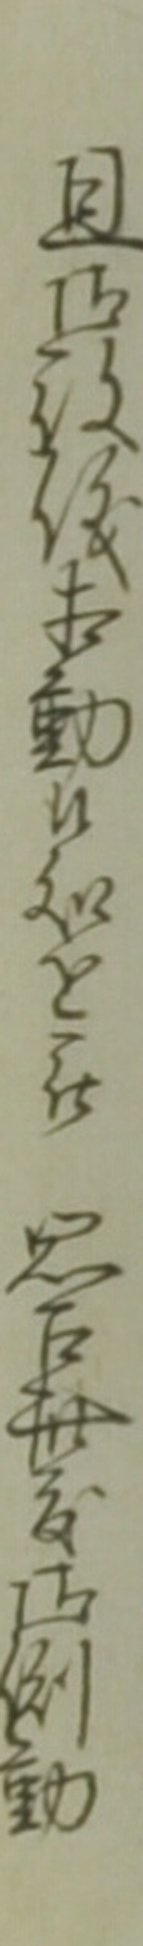且御役儀相勤候処を被思召此度御側勤

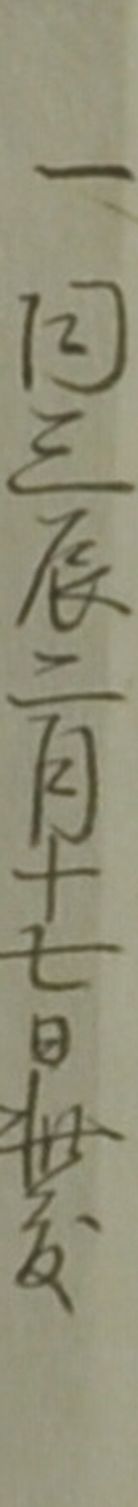一同三辰二月十七日此度
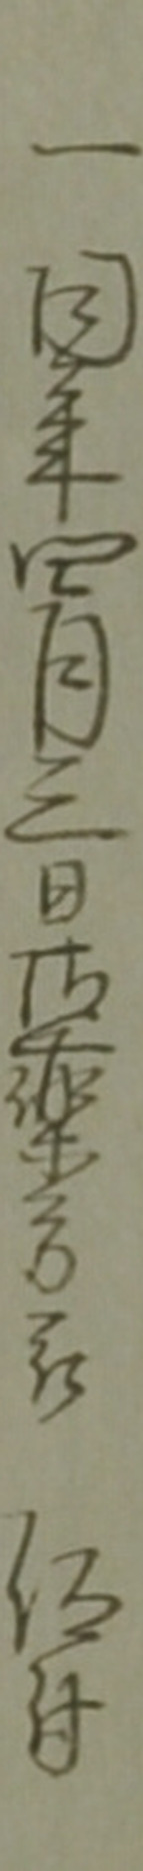一同年四月三日御薬方同年被仰付
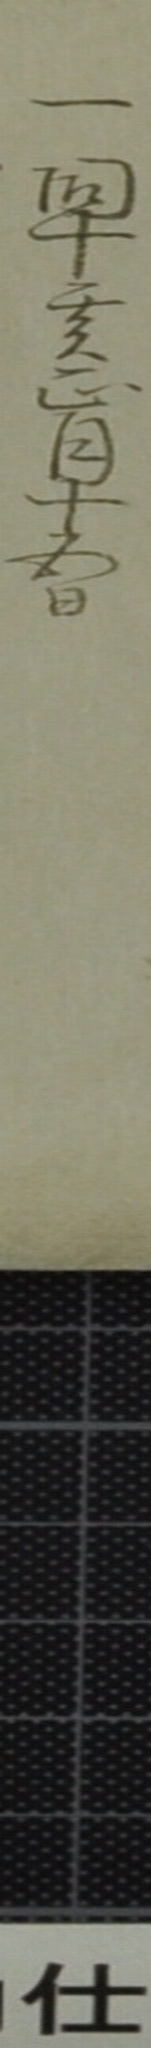一同十亥正月十五日
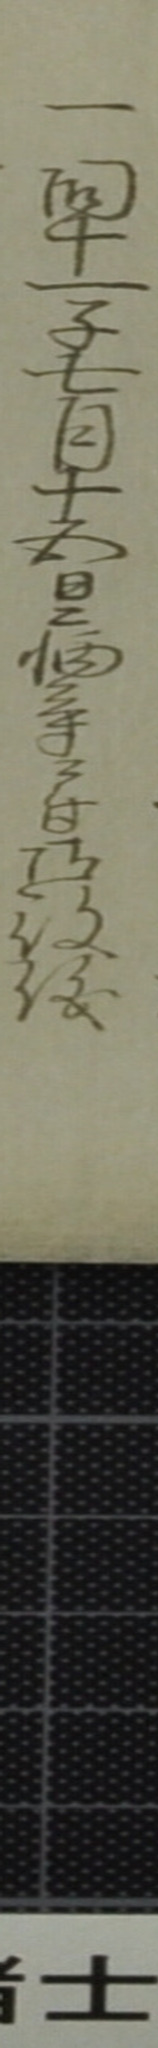一同十一子七月十五日病気ニ付御役儀
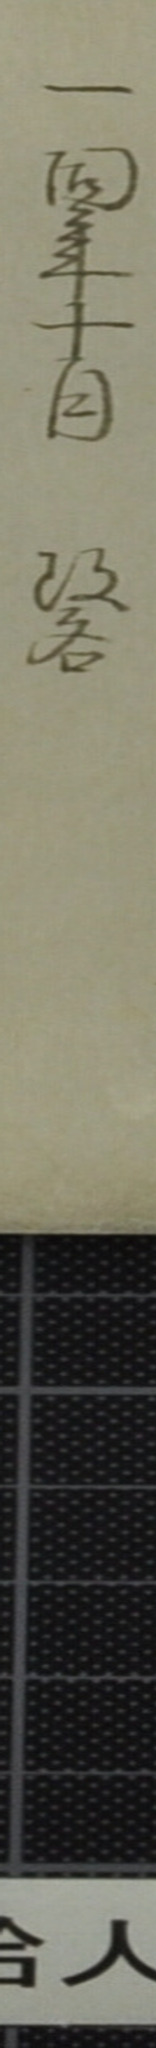一同年十月改名
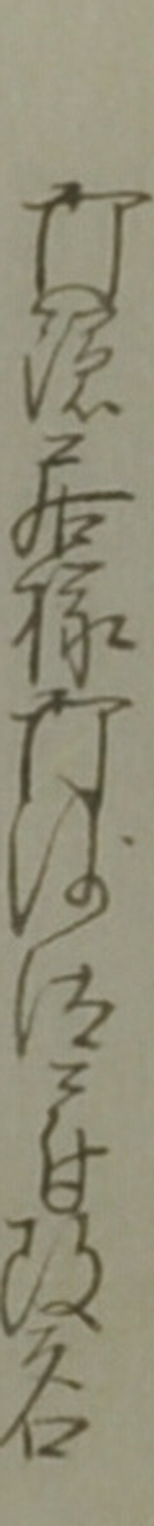御隠居様御沙汰ニ付改名
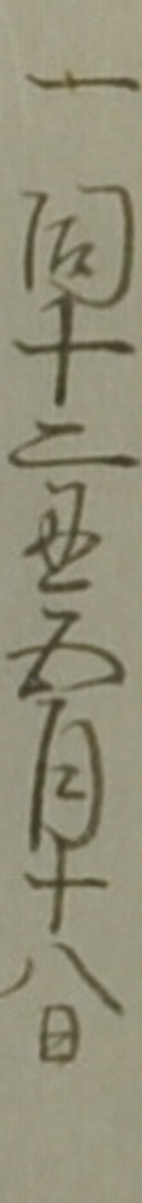一同十二丑五月十八日
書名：給人諸士勤仕録（三）
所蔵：伊那市立高遠町図書館・合同会社AMANE
